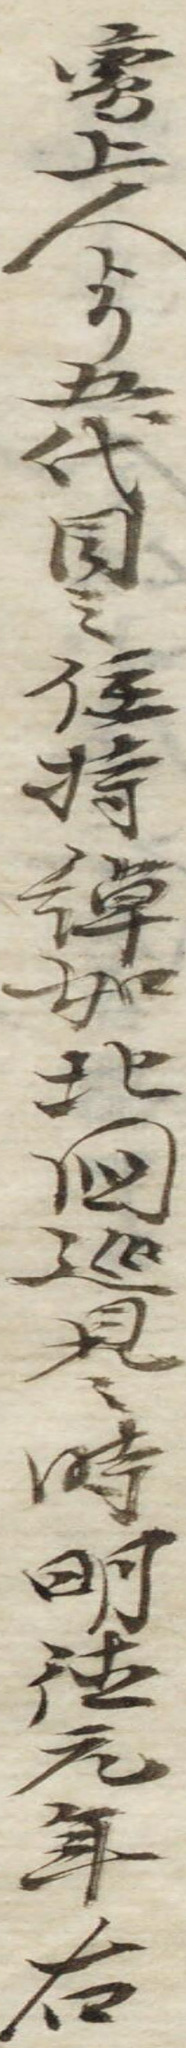鸞上人より五代目之住持綽如北国巡見之時明徳元年右
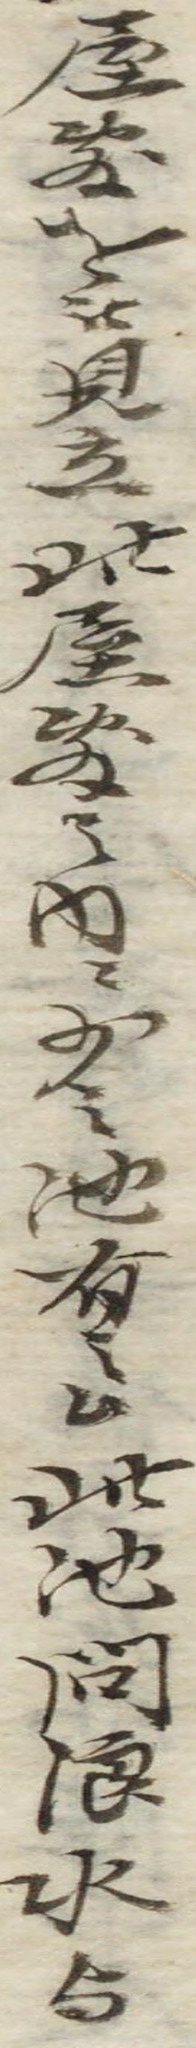屋敷を被見立此屋敷之内ニ少々池有之候此池問浪水与
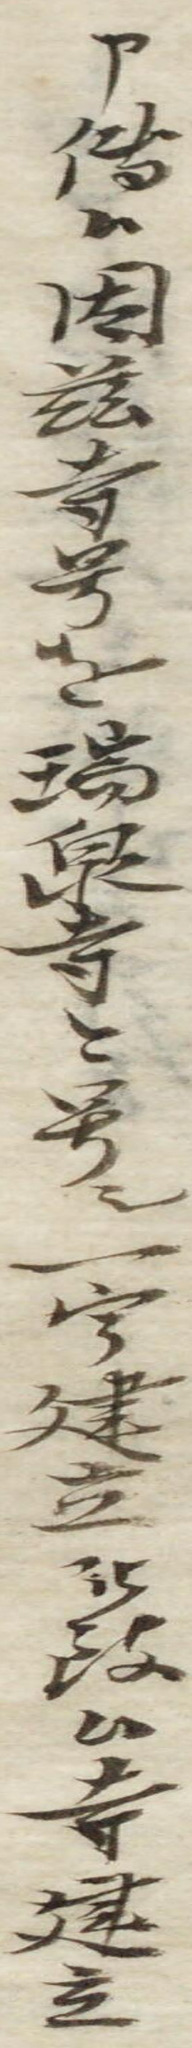申伝候因茲寺号を瑞泉寺と号シ一宇建立被致候寺建立
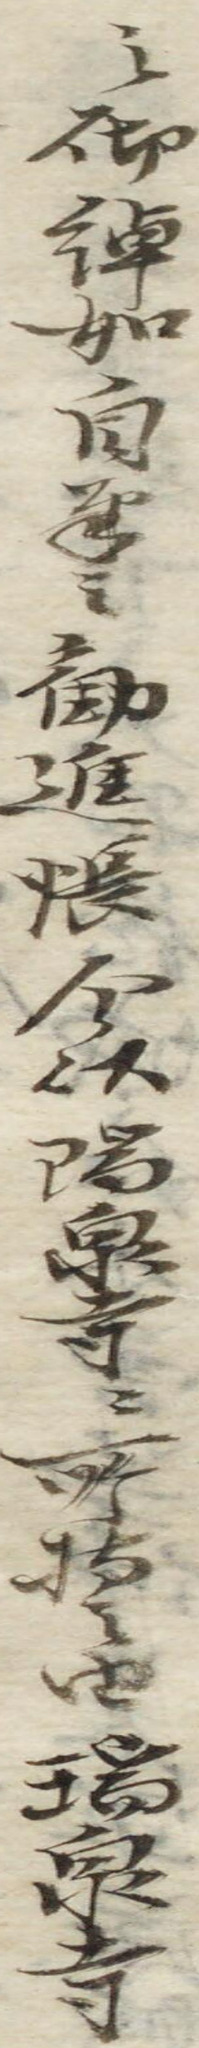之砌綽如自筆之勘進帳今以瑞泉寺ニ所持之由瑞泉寺
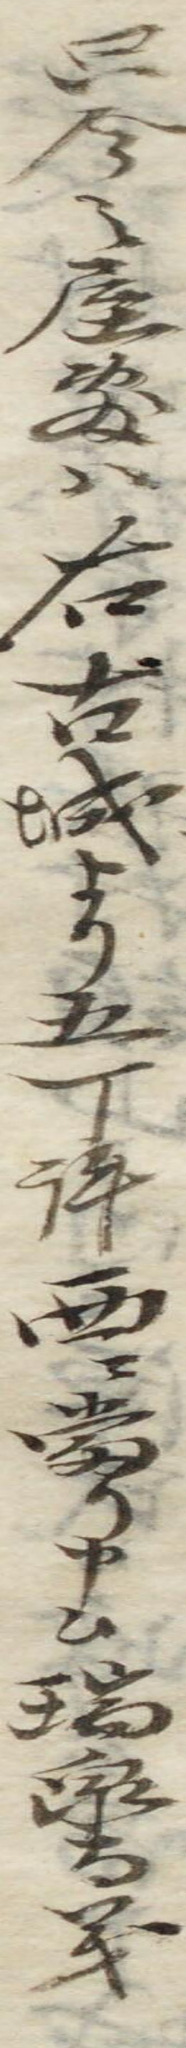只今之屋敷ハ右古城より五丁許西ニ当り申候瑞泉寺義
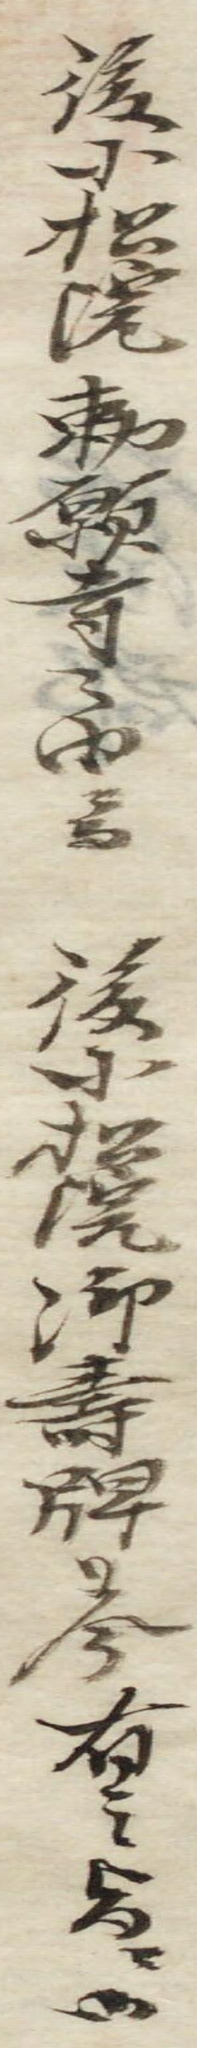後小松院勅願寺之由ニ而後小松院御寿牌尓今有之旨ニ御
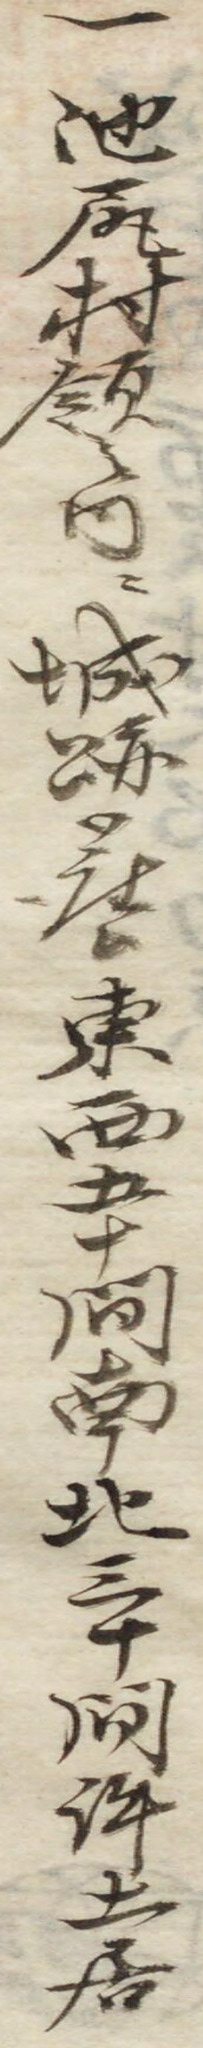一池尻村領之内ニ城跡御座候東西五十間南北三十間許土居
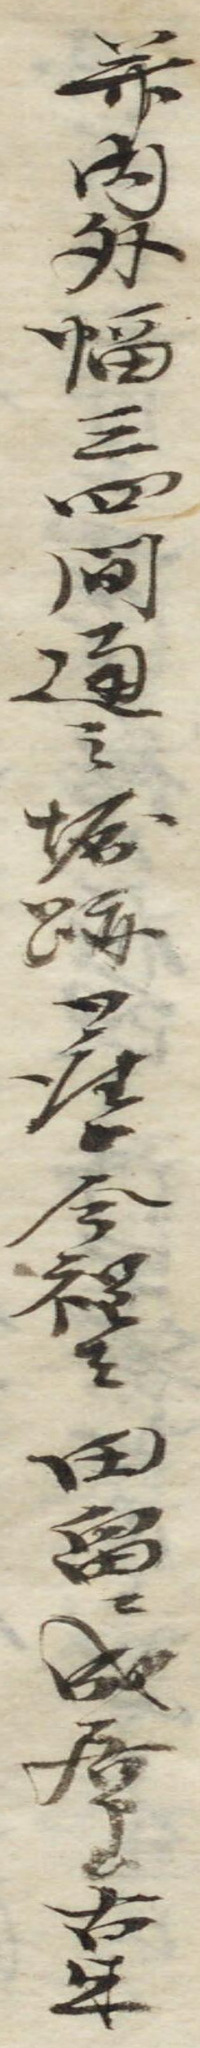并内外幅三四間通之堀跡御座候今程者田畠ニ成居申候古来
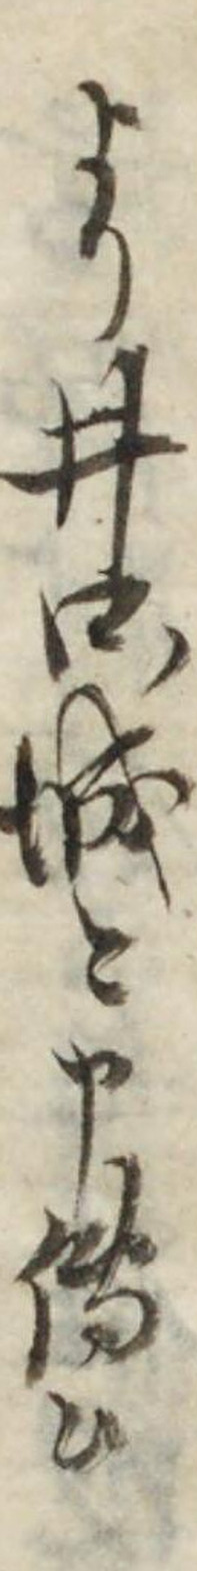より井口城と申傳候
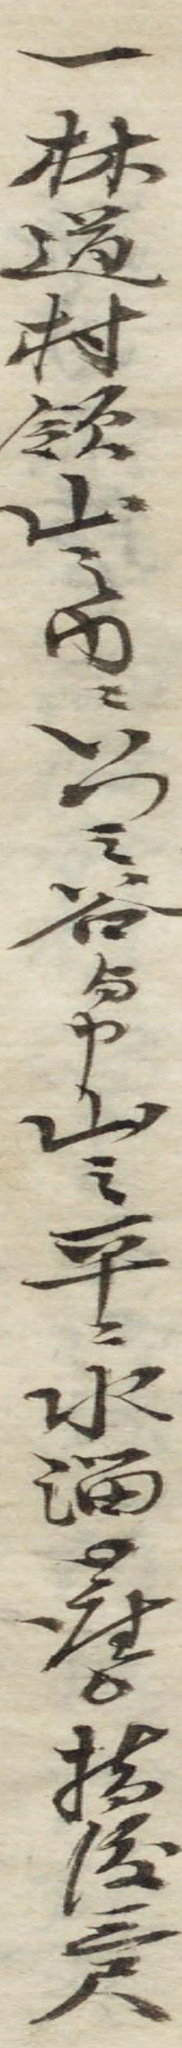一林道村領山之内にいつみ谷与申山之平に水溜御座候指渡三尺
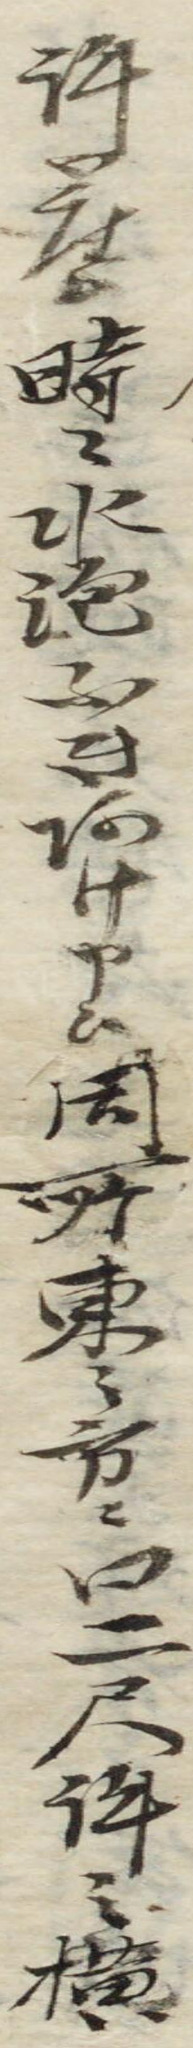許御座候時々水泡ふきあけ申候同所東之方に口二尺許之横
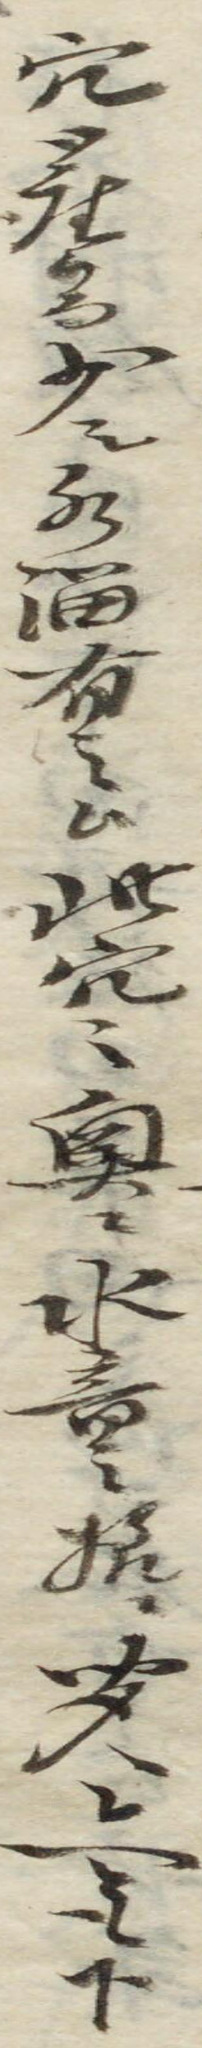穴御座候而少し水溜有之候此穴之奥に水音之様に聞へ候へとも下
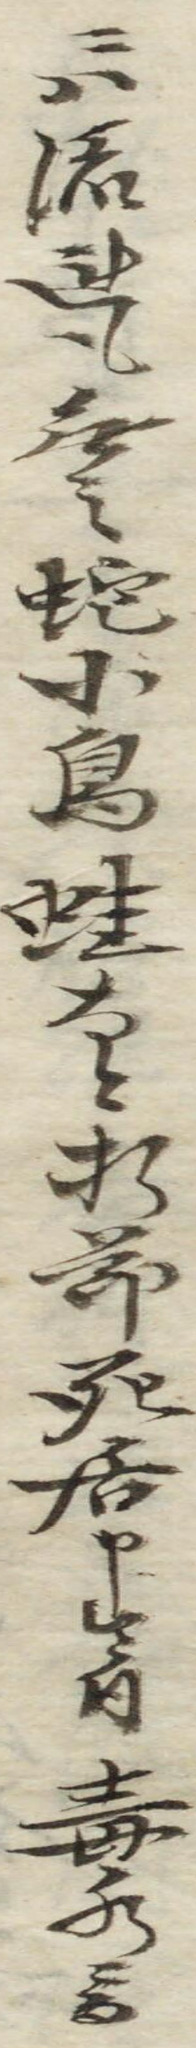には流れも無之蛇小鳥蛙なと折節し死居申候に付毒水に而
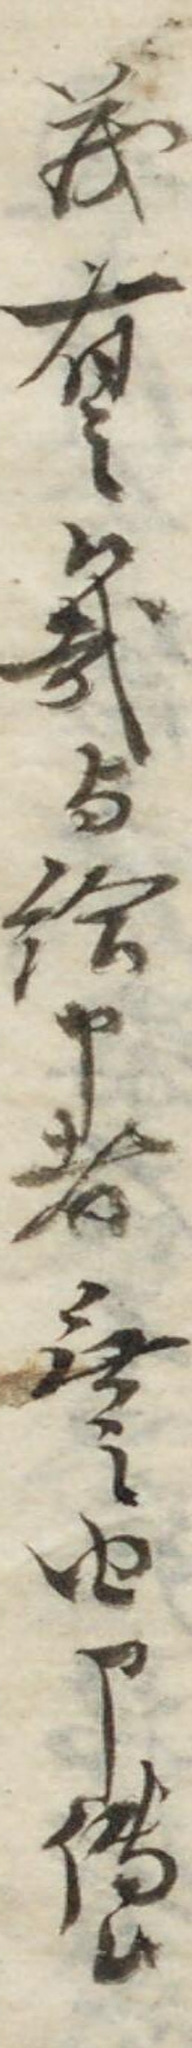も有之候哉与給申者無之由申伝候
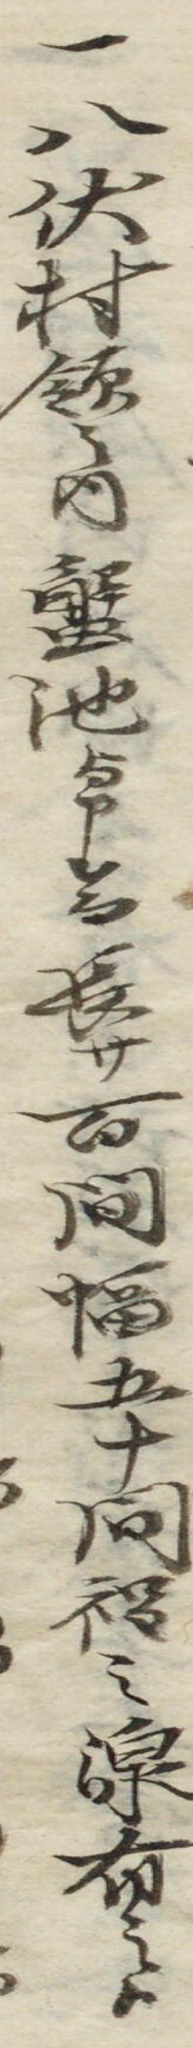一八伏村領之内蟹池与申候而長さ百間幅五十間程之湶有之候
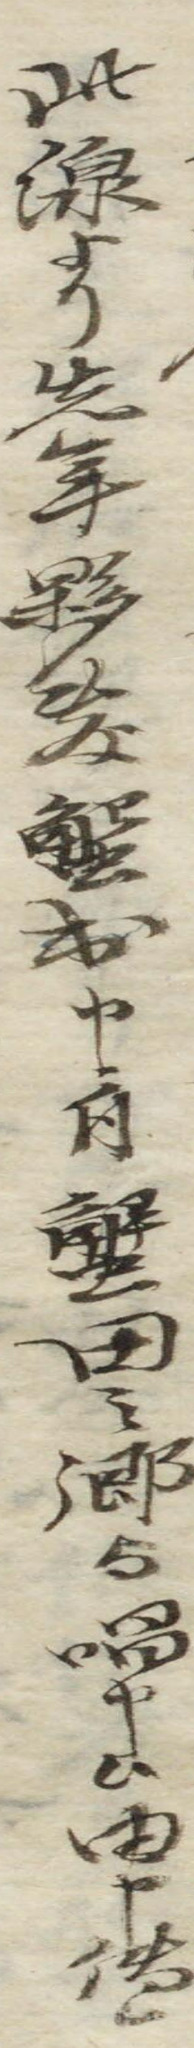此湶より先年夥敷蟹出申に付蟹田ノ郷与唱申候由申伝候
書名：加越能旧聞録
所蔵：Ishikawa Prefectural Library
